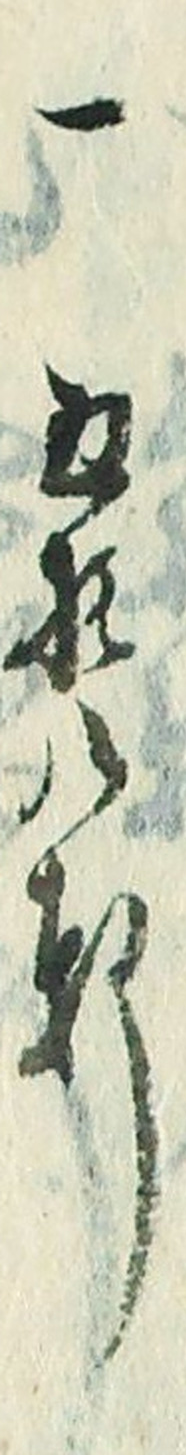一三拾九軒
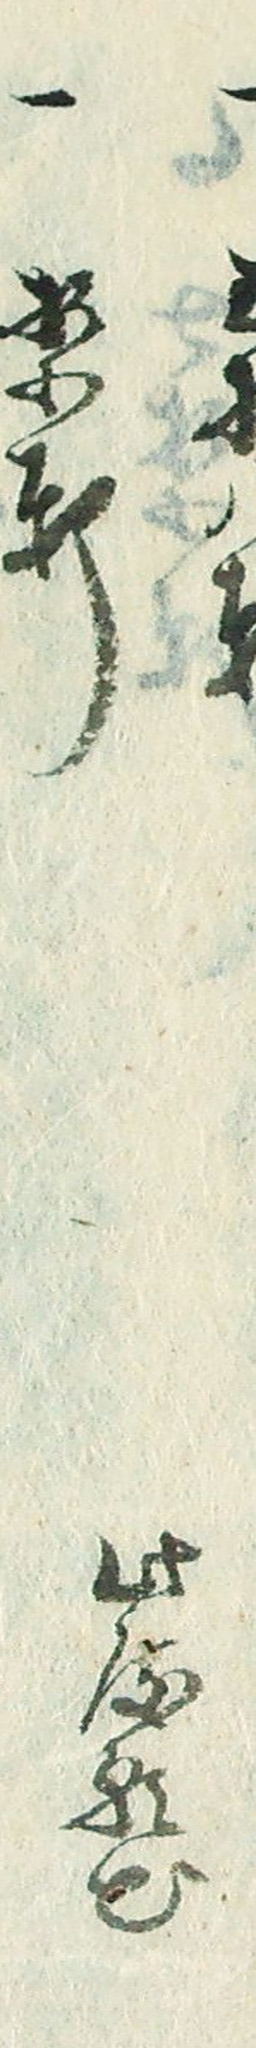一拾五軒此度願出
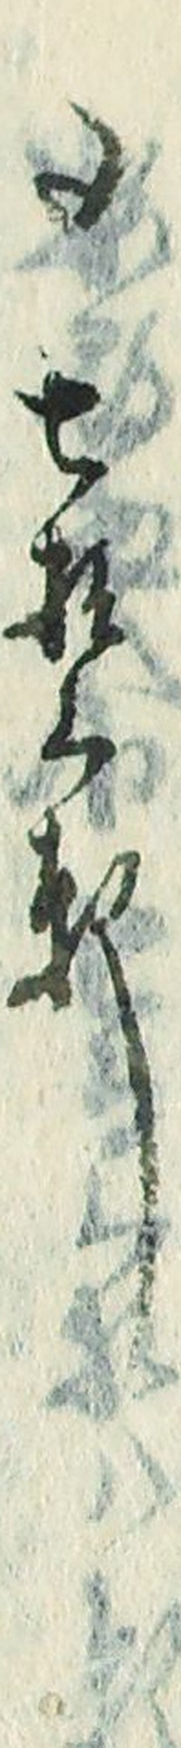〆七拾三軒
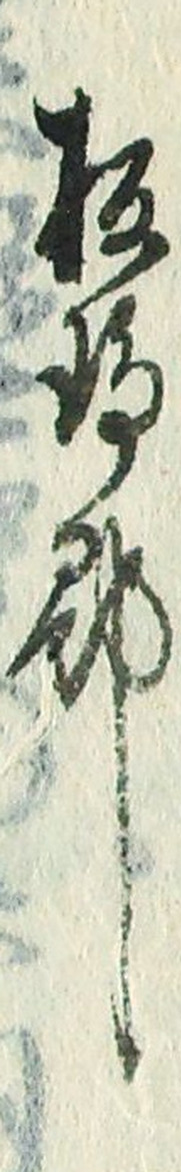板野郡
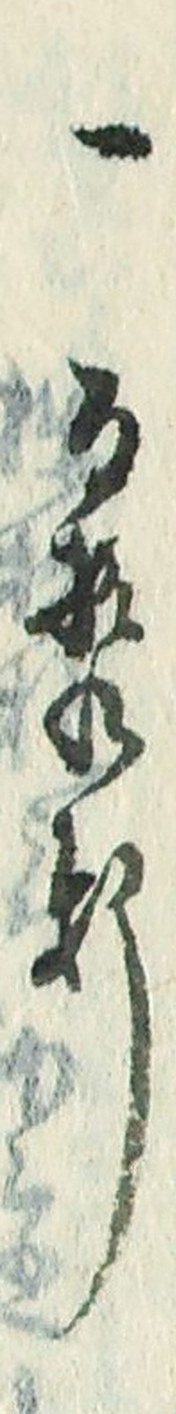一三拾九軒
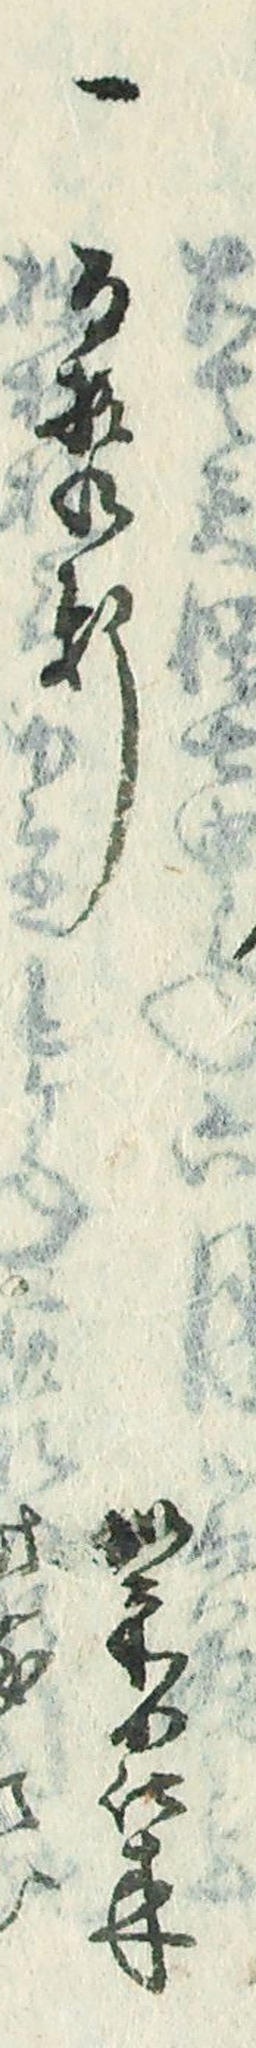一五拾八軒以前ゟ仕来
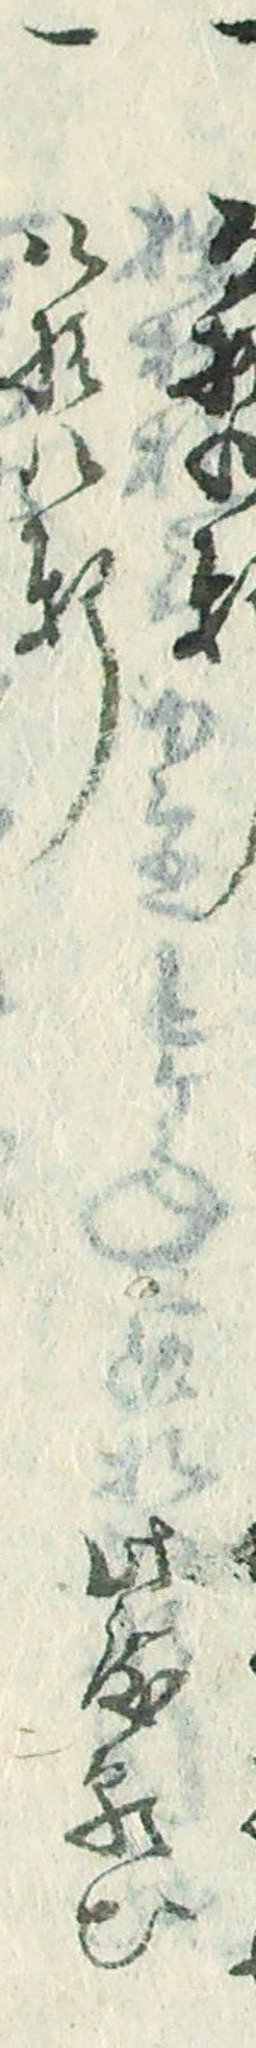一八拾八軒此度願出
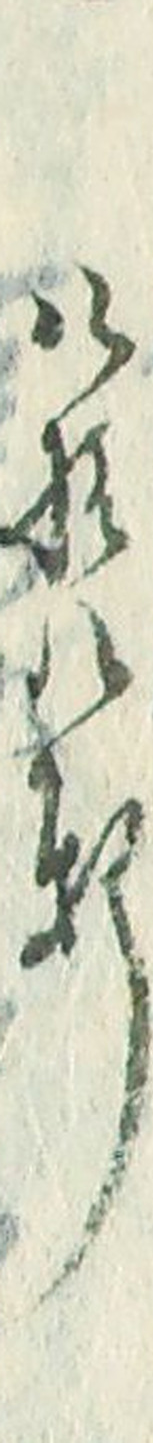一三拾九軒
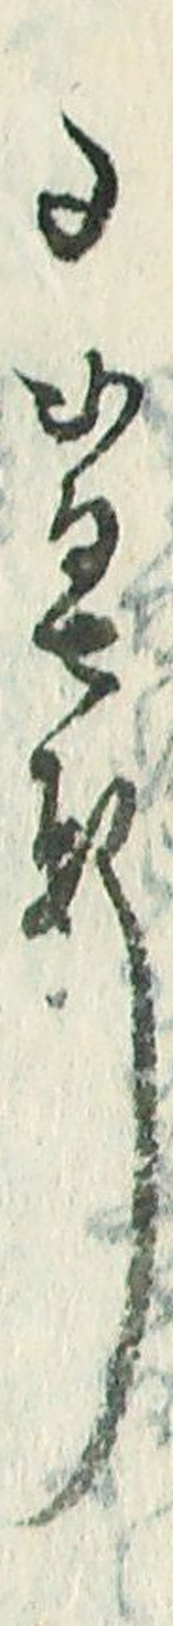〆弐百七軒

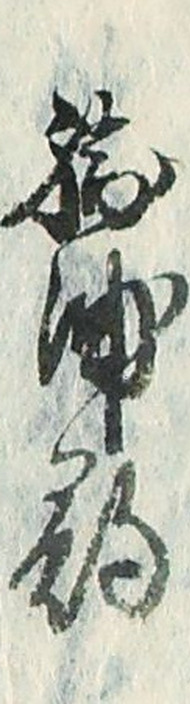勝浦触
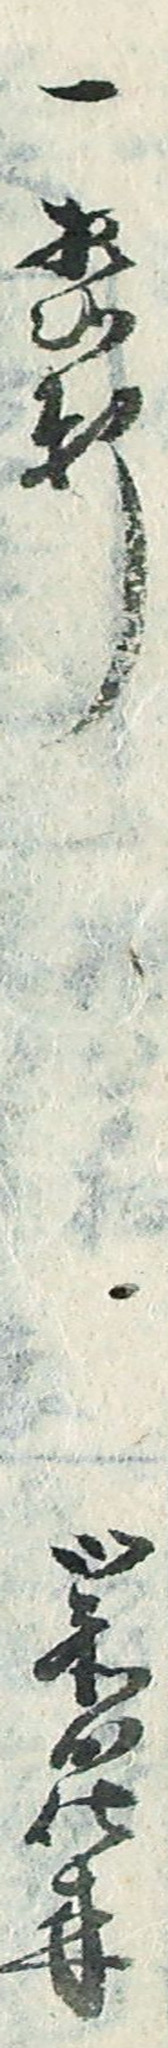一拾弐軒以前ゟ仕来
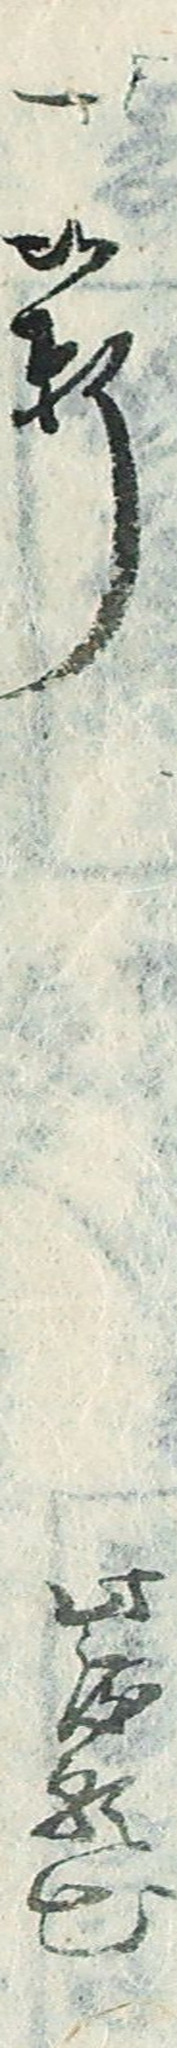一弐軒此度願出
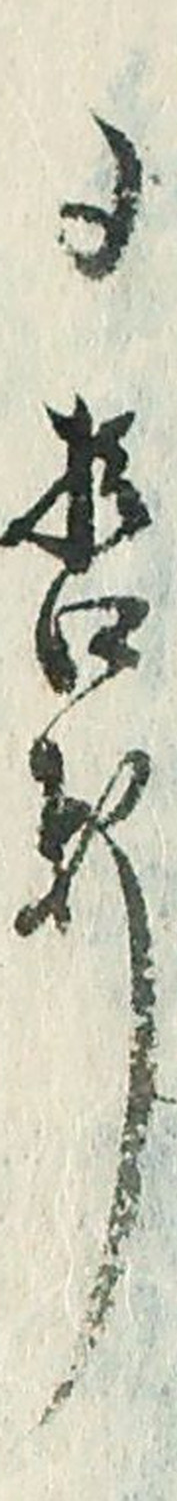〆拾四軒
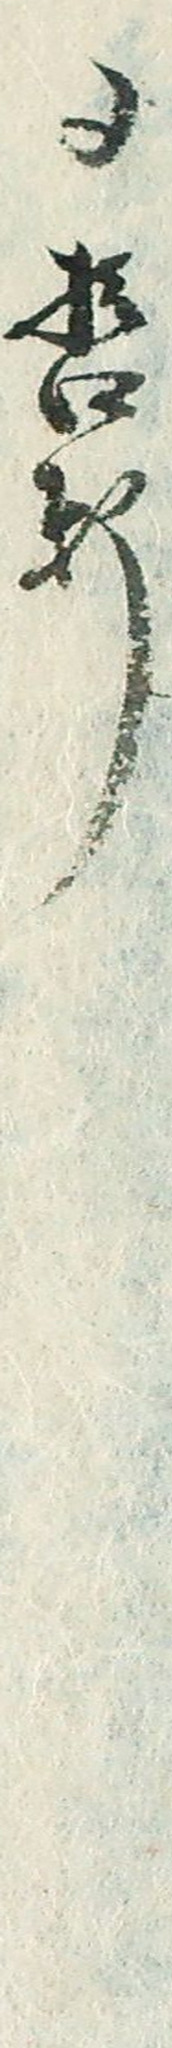〆拾四軒
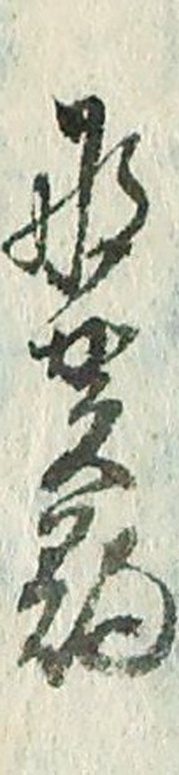那賀触
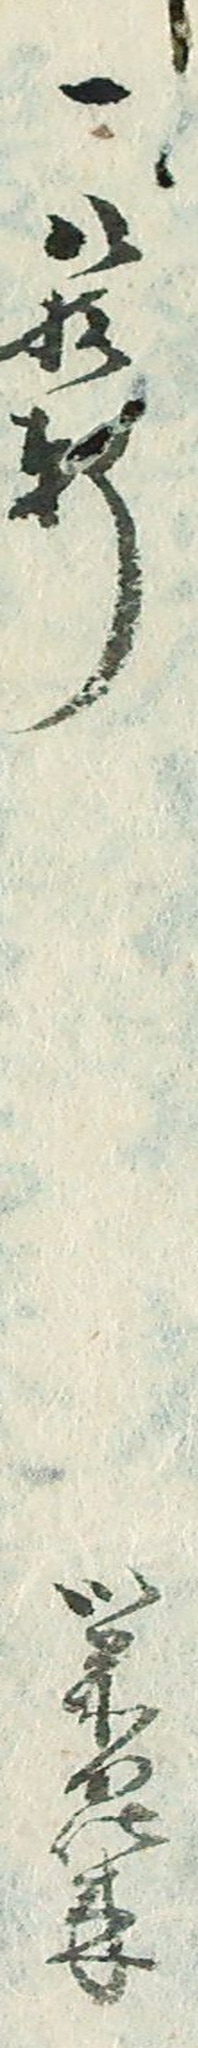一八拾軒以前ゟ仕来
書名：市郷質屋株御取究並御書出御趣法之写
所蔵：鳴門教育大学 Naruto University of Education
